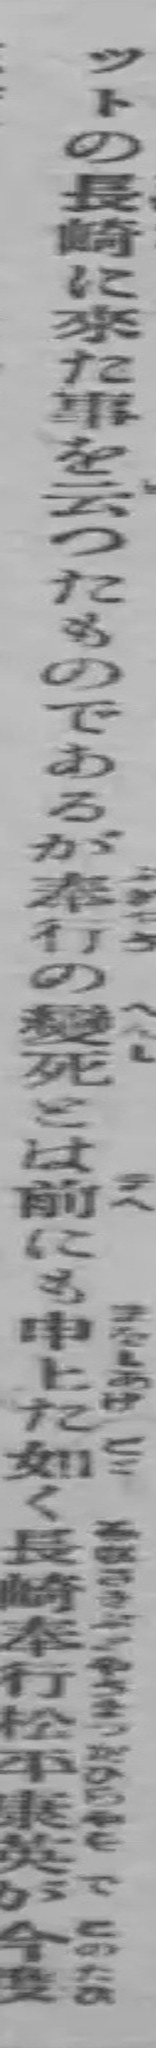ツトの長崎に来た事を云つたものであるが奉行の変死とは前にも申上た如く長崎奉行松平康英が今度
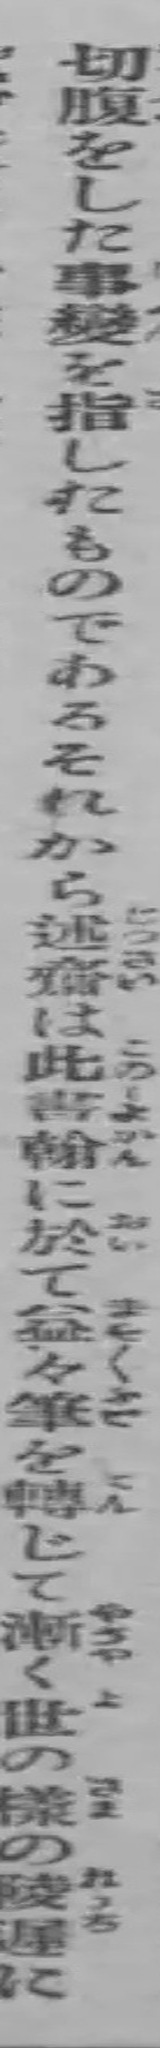切腹をした事変を指したものであるそれから述斉は此書翰に於て益々筆を転じて漸く世の様の陵遅に
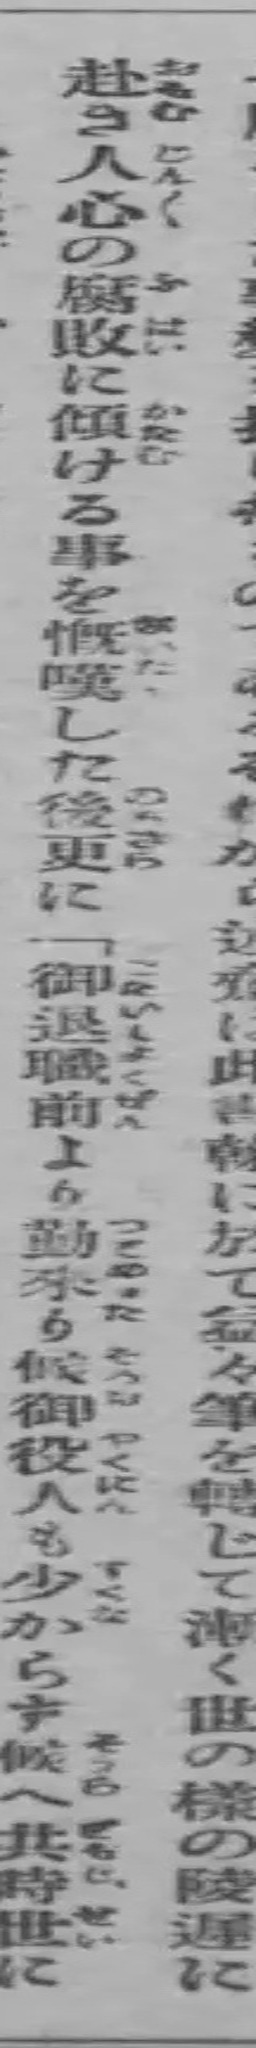趣き人心の腐敗に傾ける事を慨嘆した後更に「御退職前より勤来り候御役人も少からず候へ共時世に
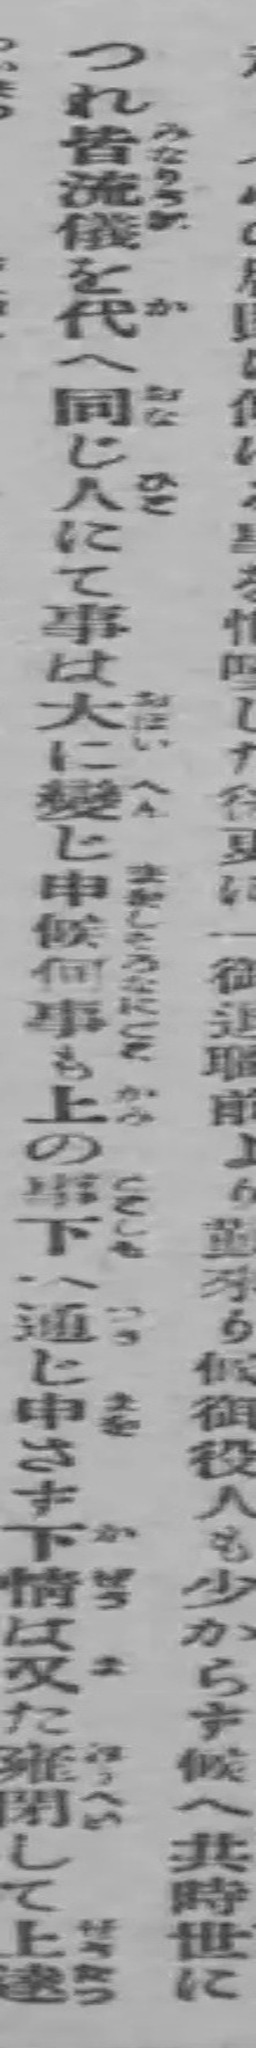つれ皆流儀を代へ同じ人にて事は大に変じ申候何事も上の事下へ通じ申さず下情は又た雍閉して上達
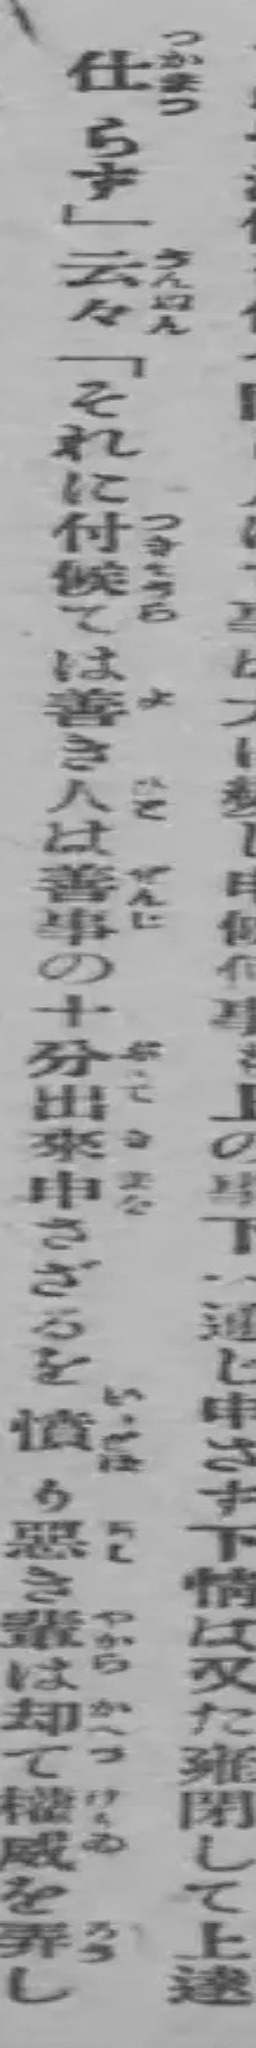仕らず」云々「それに付候ては善き人は善事の十分出来申さざるを憤り悪き輩は却て権威を弄し
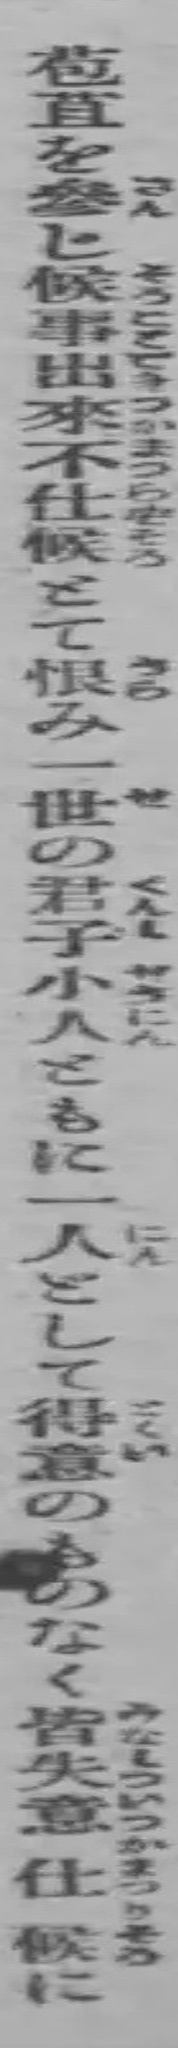苞苴を参じ候事出来不仕候とて恨み一世の君子小人ともに一人として得意のものなく皆失意仕候に
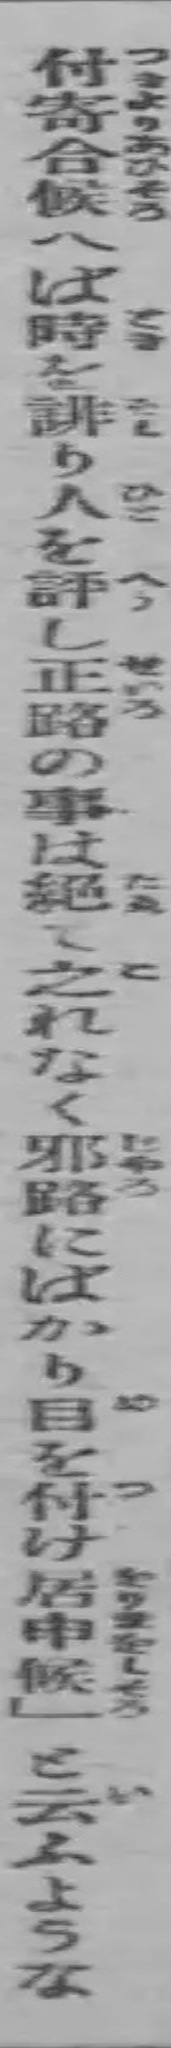付寄合候へば時を誹り人を評し正路の事は絶て之れなく邪路にばかり目を付け居申候」と云ふような
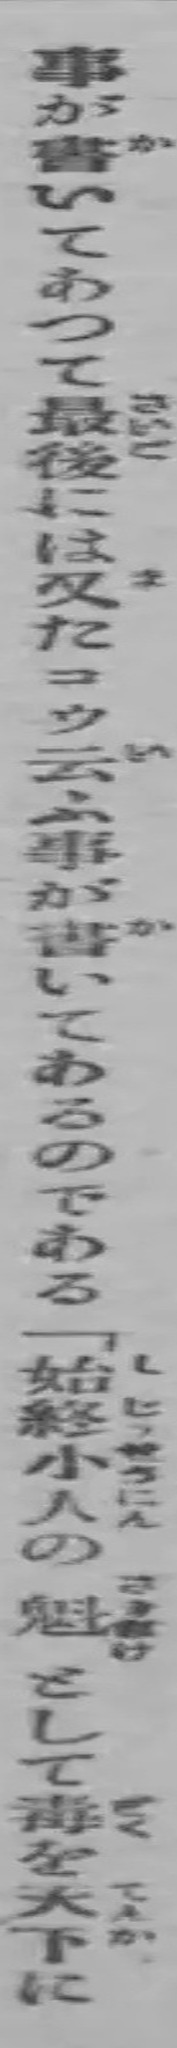事が書いてあつて最後には又たコウ云ふ事が書いてあるのである「始終小人の魁として毒を天下に
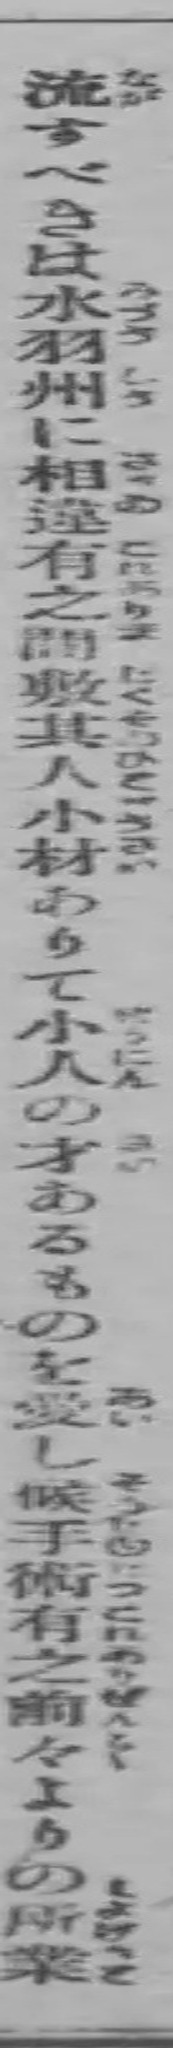流すべきは水羽州に相違有之間敷其人小材ありて小人の才あるものを愛し候手術之有前々よりの所業
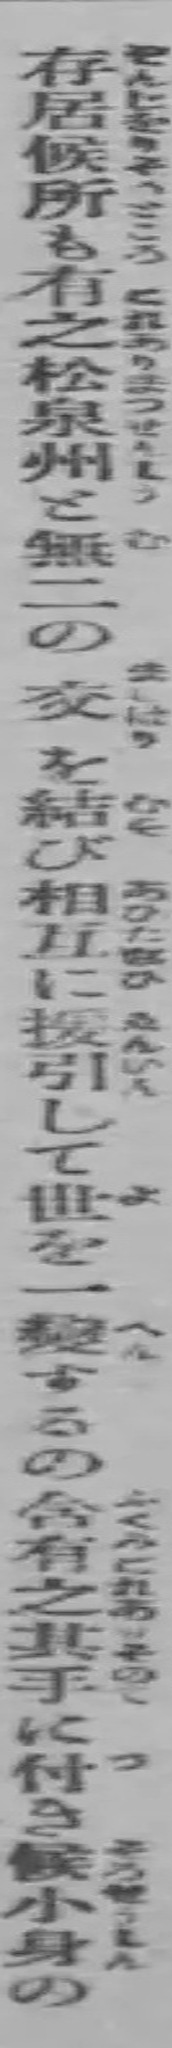存居候所も有之松泉州と無二の交を結び相互に援引して世を一変するの含有之其手に付き候小身の
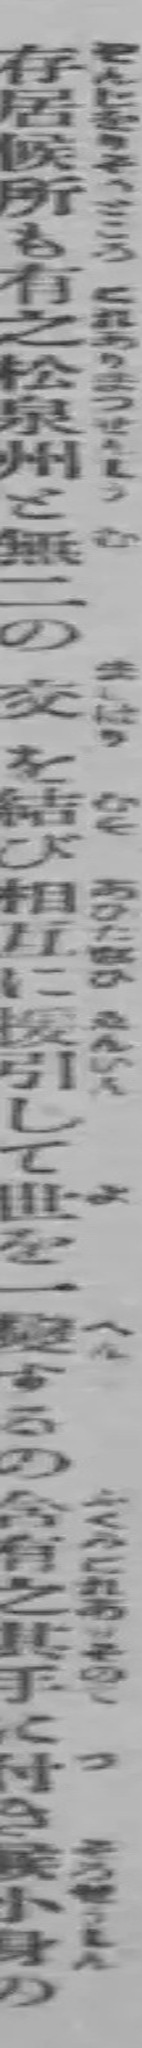存居候所も有之松泉州と無二の交を結び相互に援引して世を一変するの含有之其手に付き候小身の
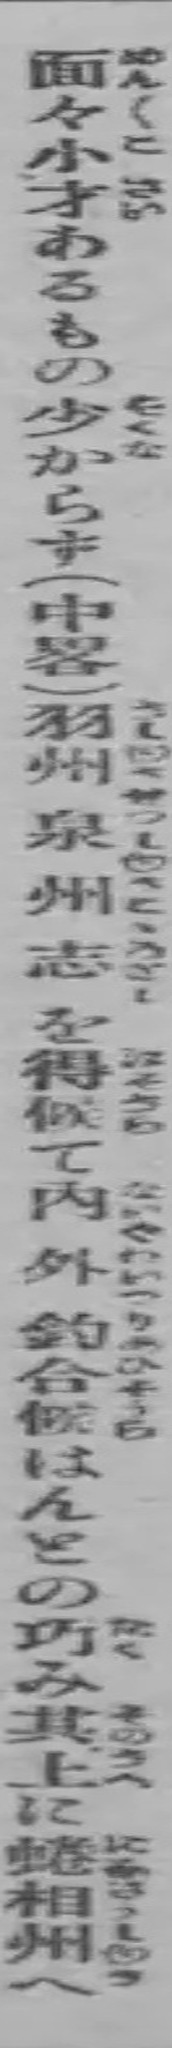面々小才あるもの少からず(中略)羽州泉州志を得候て内外釣合候はんとの巧み其上に蜷相州へ
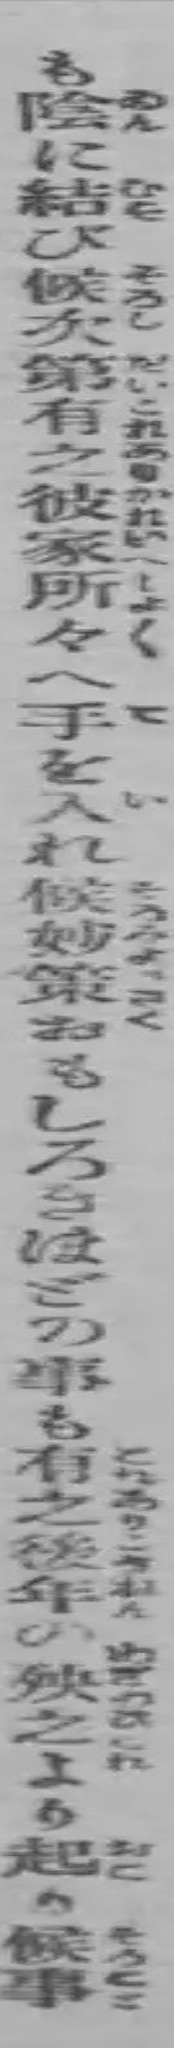も陰に結び候次第有之彼家所々へ手を入れ候妙策おもしろきほどの事も有之後年の殃之より起り候事
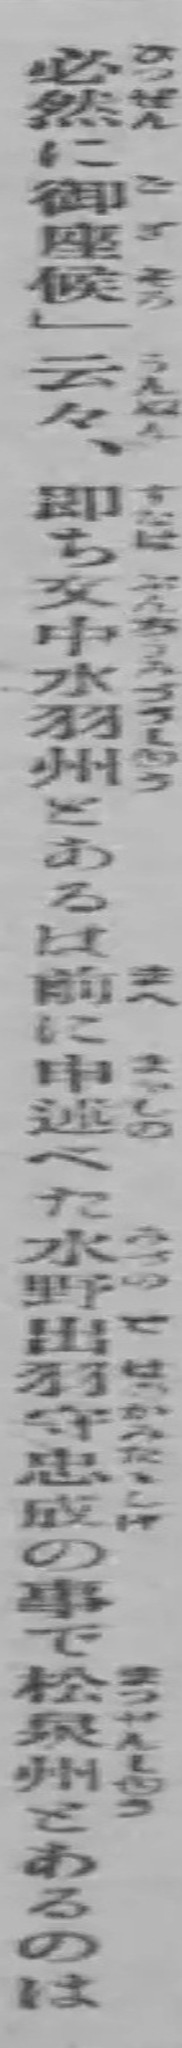必然に御座候」云々、即ち文中水羽州とあるは前に申述べた水野出羽守忠成の事で松泉州とあるのは
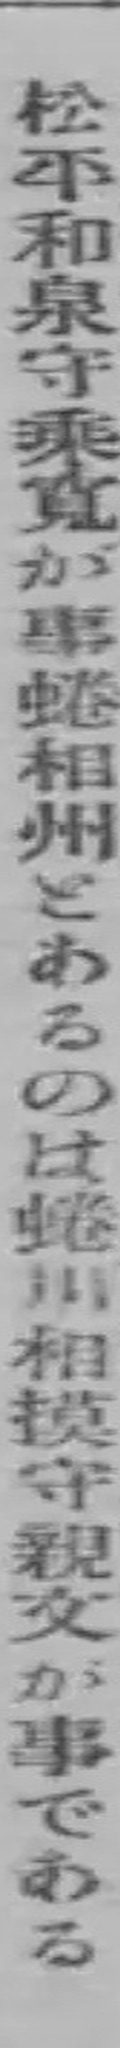松平和泉守乗寛が事蜷相州とあるのは蜷川相模守親文が事である
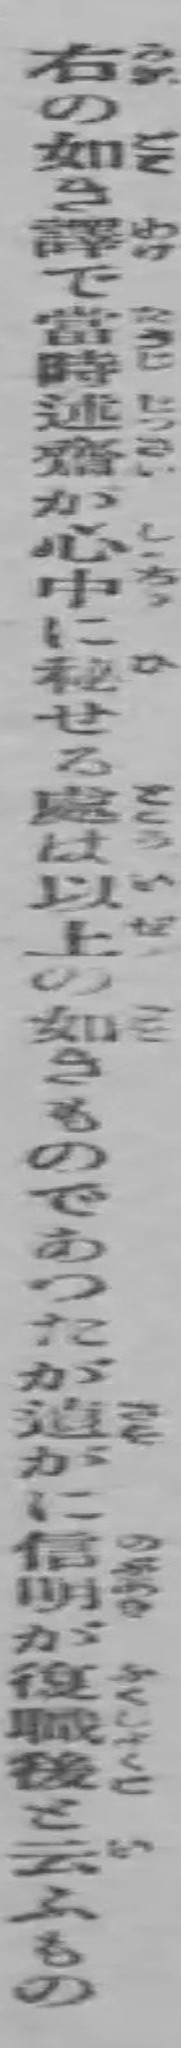右の如き訳で当時述斉が心中に秘せる処は以上の如きものであつたが遉がに信明が復職後と云ふもの
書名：豊橋市史談
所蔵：国立国会図書館 National Diet Library, JAPAN
